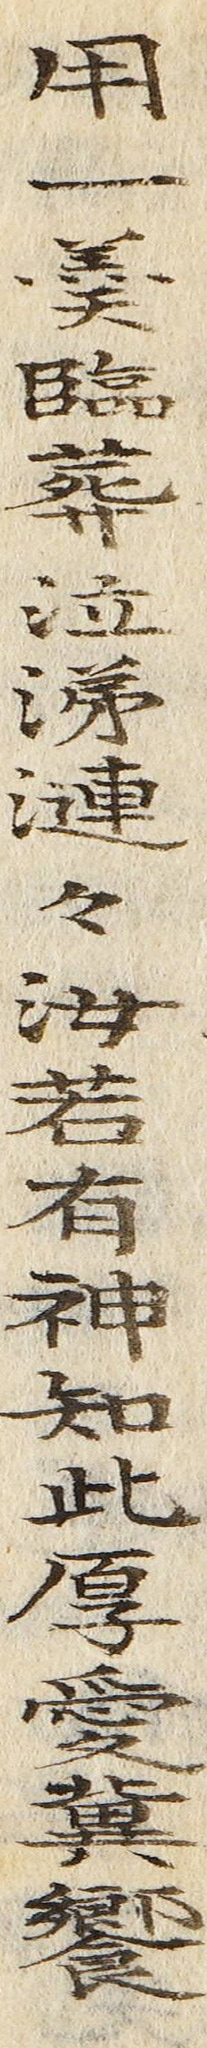用一羹臨葬泣涕漣々汝若有神知此厚愛冀饗
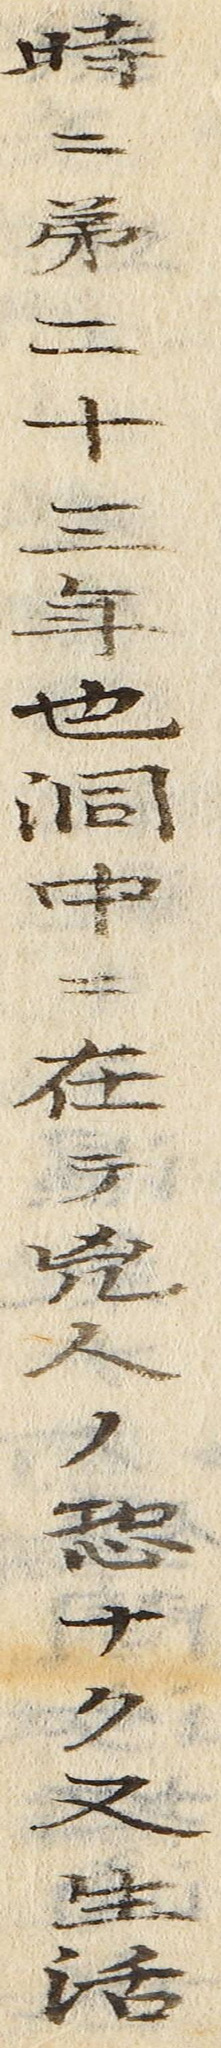時ニ第二十三年也洞中ニ在テ兇人ノ恐ナク又生活
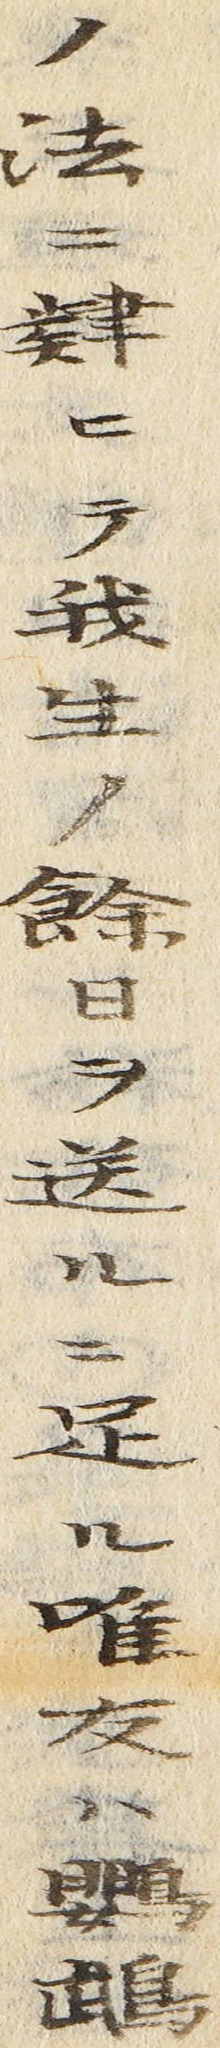ノ法ニ肄ヒテ我生ノ余日ヲ送ルニ足ル唯友ハ鸚鵡
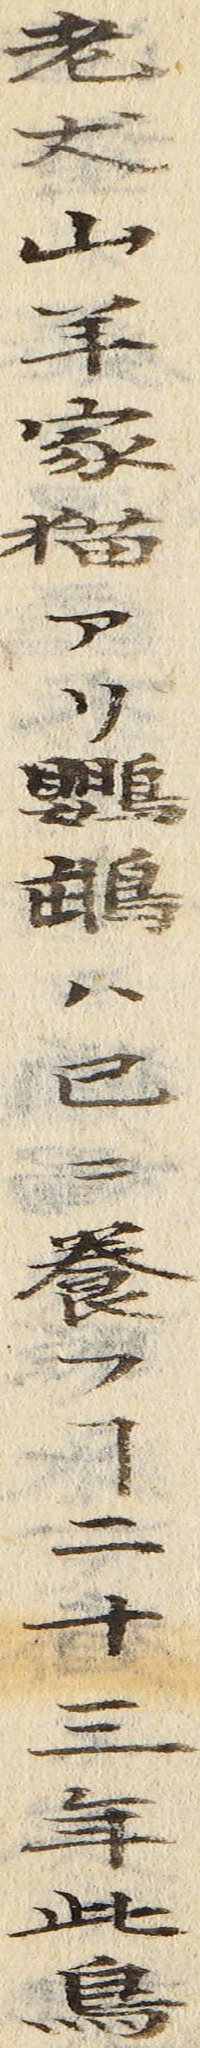老犬山羊家猫アリ鸚鵡ハ已ニ養フコト二十三年此鳥
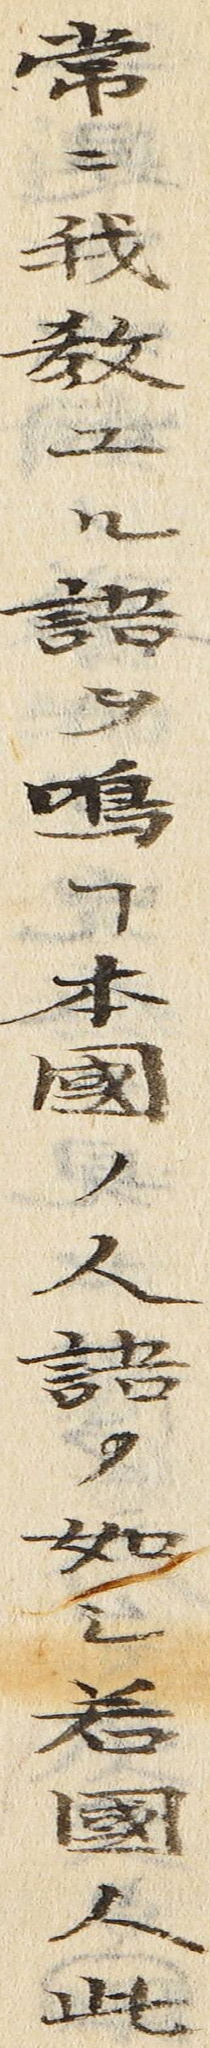常ニ我教ユル語ヲ鳴コト本国ノ人語ノ如シ若国人此
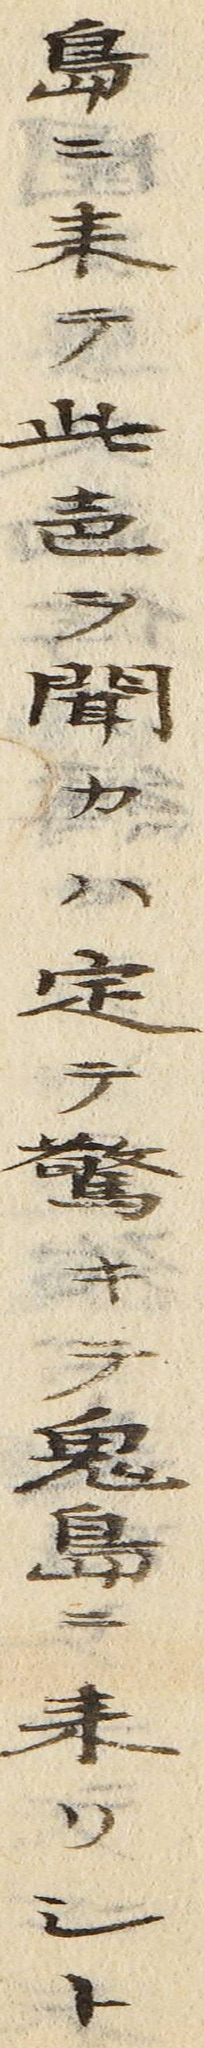島ニ来テ此声ヲ聞カハ定テ驚キテ鬼島ニ来リシト
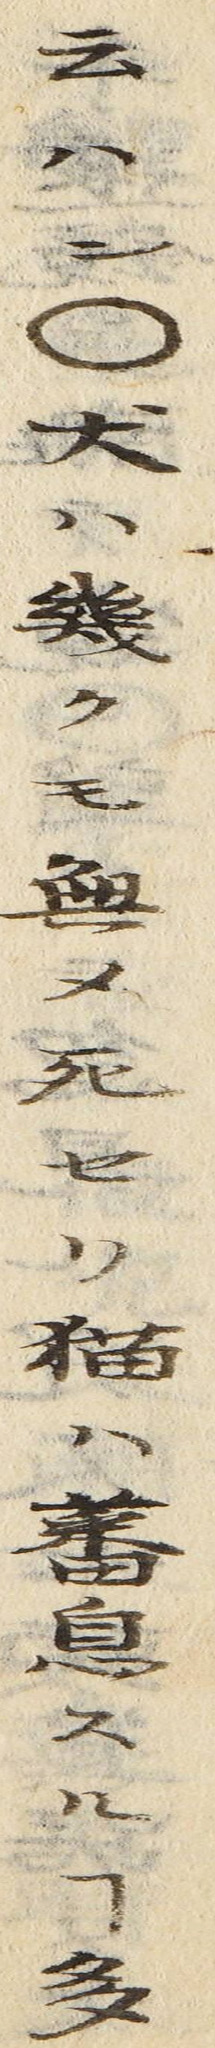云ハン◯犬ハ幾クモ無シテ死セリ猫ハ蕃息スルコト多
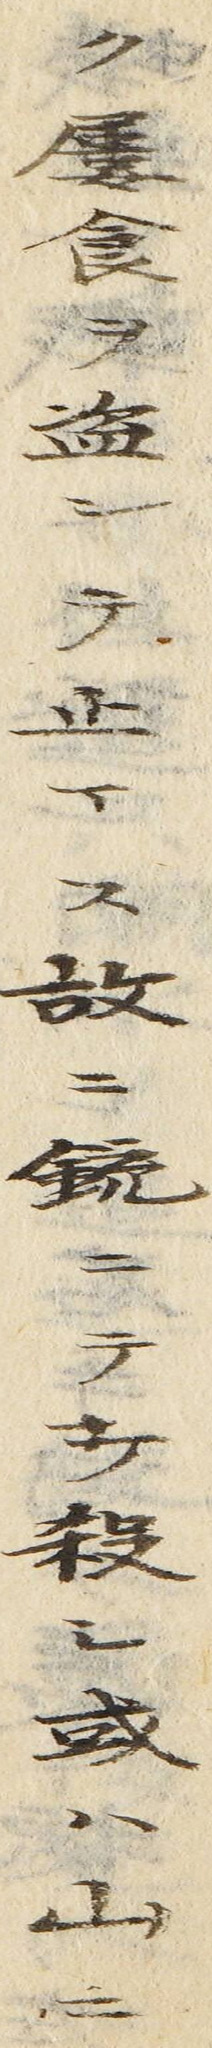ク屡食ヲ盗ンテ止マス故ニ銃ニテ打殺シ或ハ山ニ
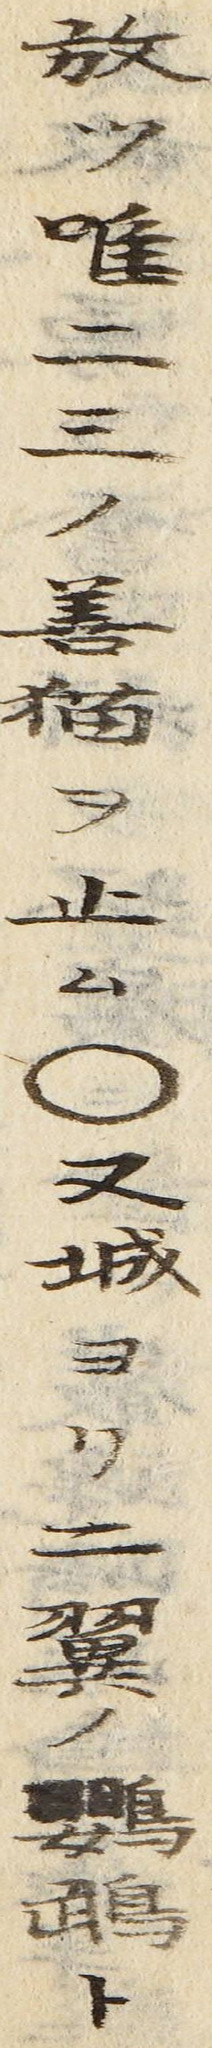放ツ唯二三ノ善猫ヲ止ム◯又城ヨリ二翼ノ鸚鵡ト
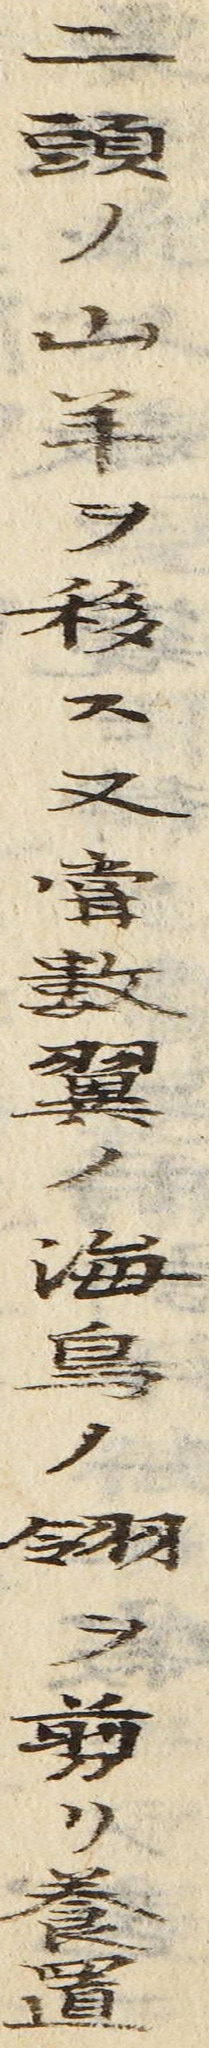二頭ノ山羊ヲ移ス又嘗数翼ノ海鳥ノ翎ヲ剪リ養置
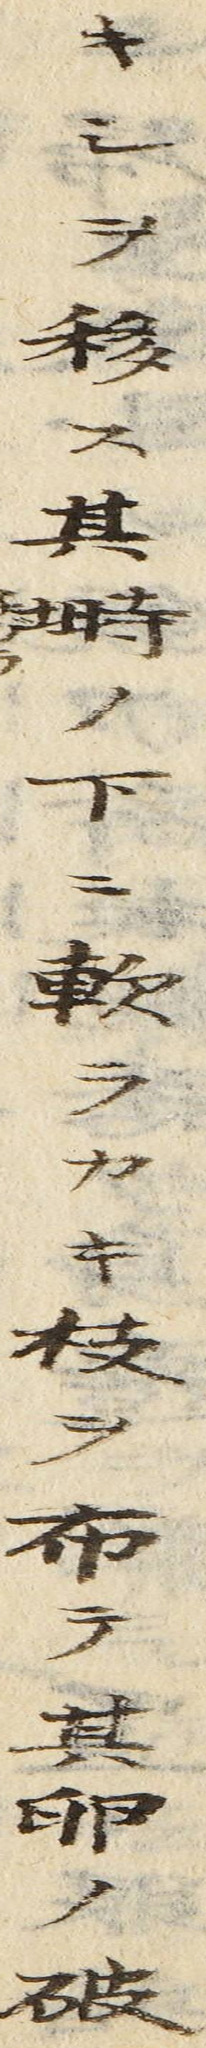キシヲ移ス其塒ノ下ニ軟ラカキ枝ヲ布テ其卵ノ破
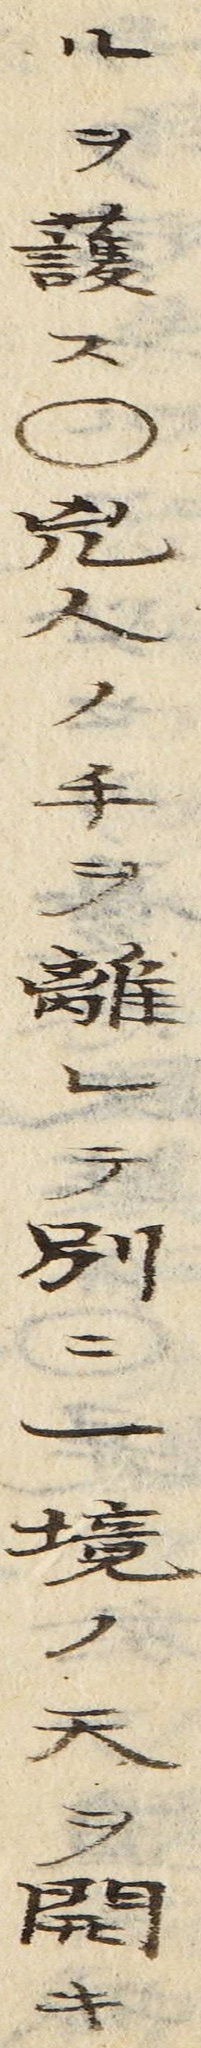ルヲ護ス◯兇人ノ手ヲ離レテ別ニ一境ノ天ヲ開キ
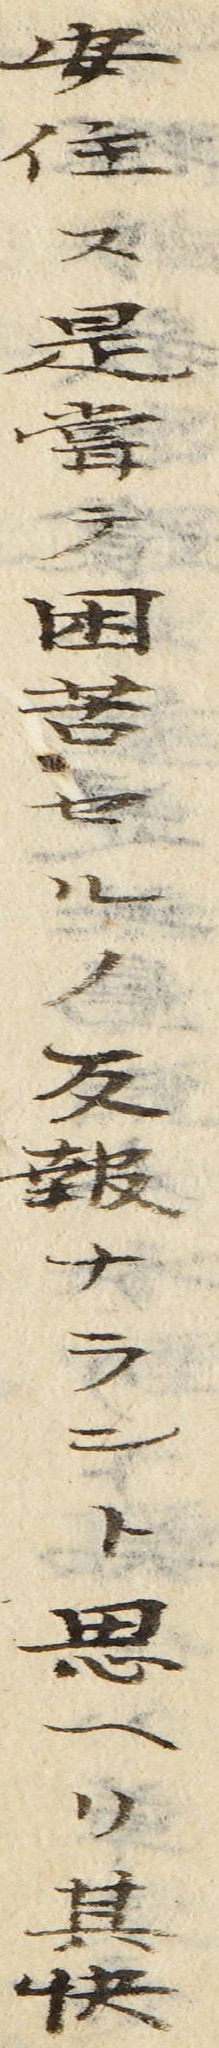安住ス是嘗テ困苦セルノ反報ナラント思ヘリ其快
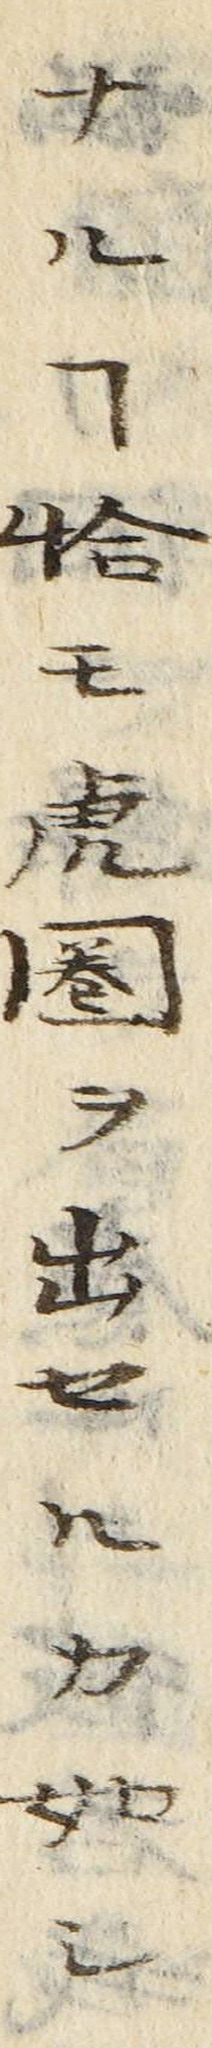ナルコト恰モ虎圏ヲ出セルカ如シ
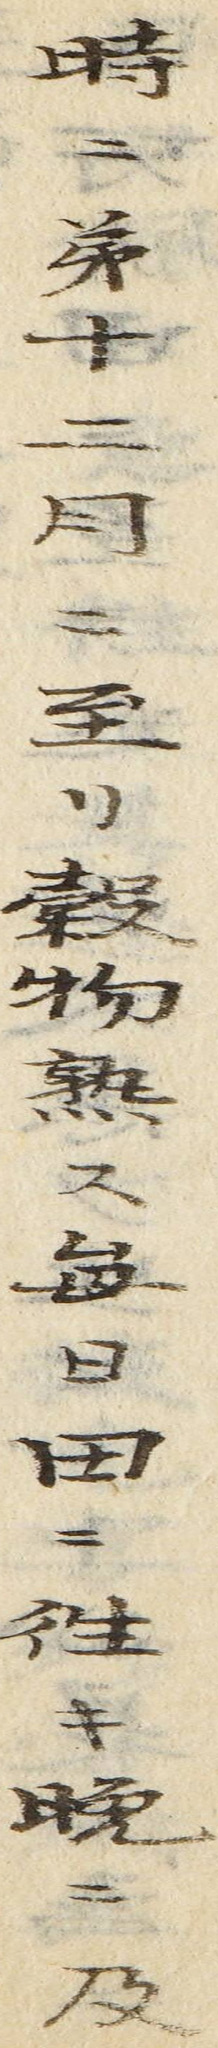時ニ第十二月ニ至リ穀物熟ス毎日田ニ往キ晩ニ及
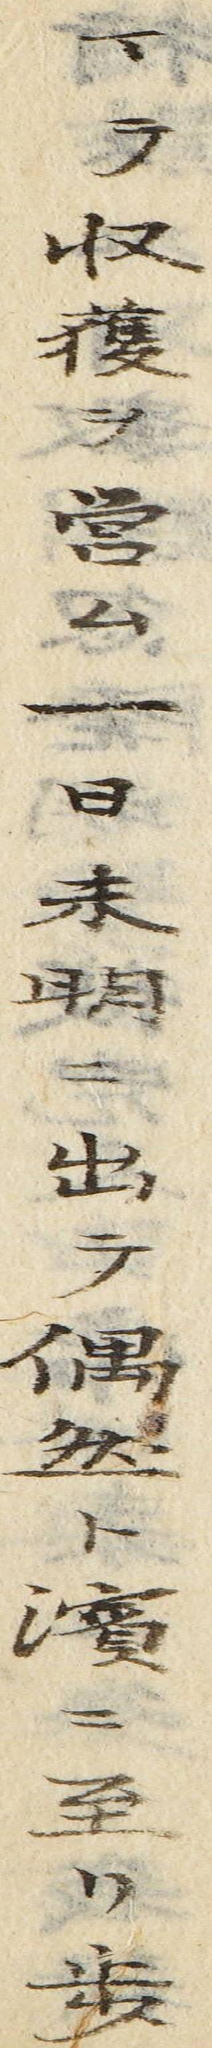マテ収穫ヲ営ム一日未明ニ出テ偶然ト浜ニ至リ歩
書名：漂流紀事
